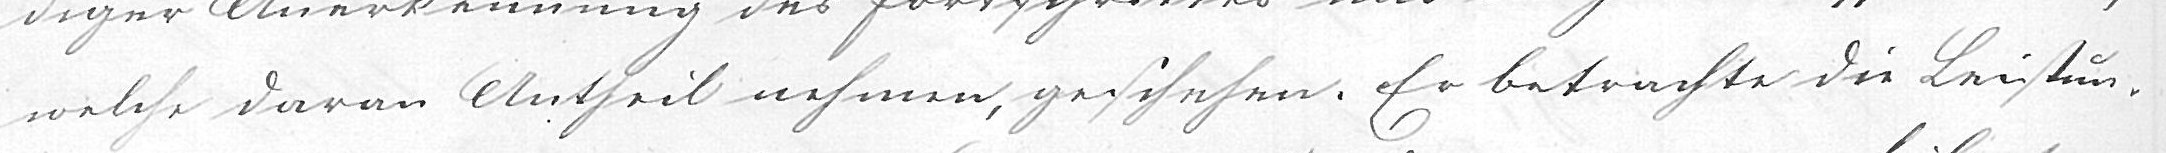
welche daran Antheil nehmen, geschehen. Er betrachte die Leistun-
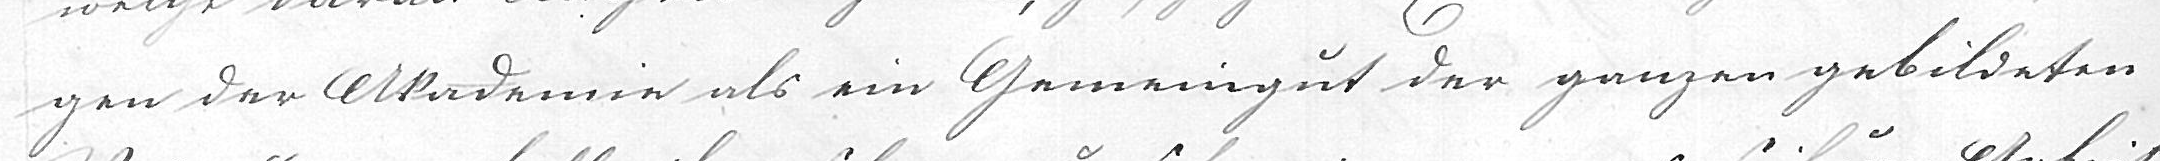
gen der Akademie als ein Gemeingut der ganzen gebildeten
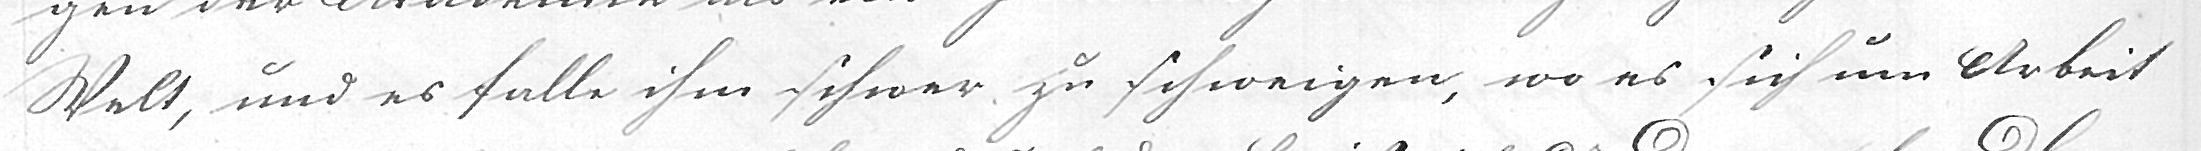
Welt, und es falle ihm schwer zu schweigen, wo es sich um Arbeit
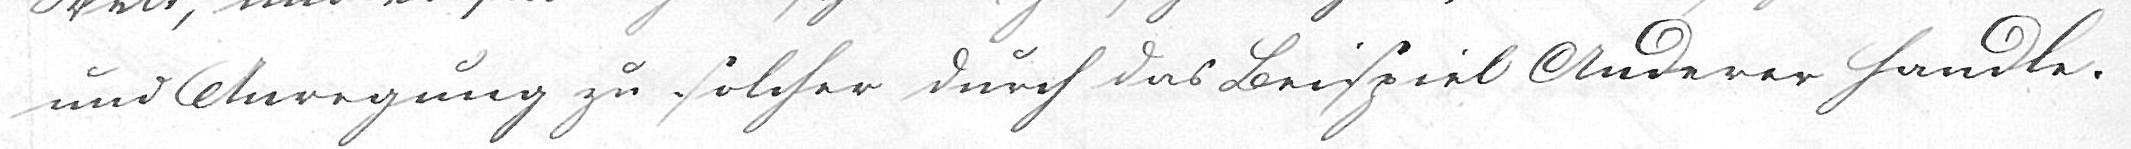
und Anregung zu solcher durch das Beispiel Anderer handle.
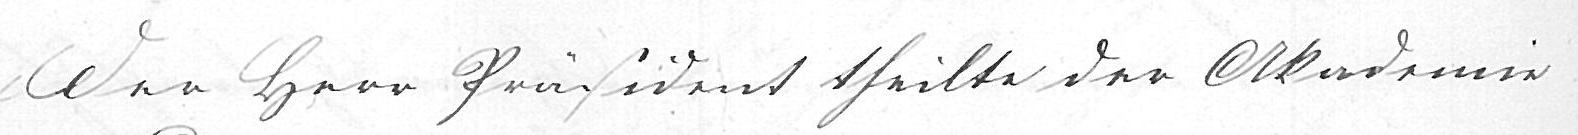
Der Herr Präsident theilte der Akademie
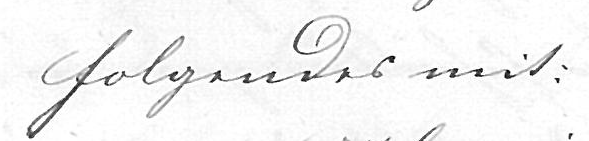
folgendes mit:
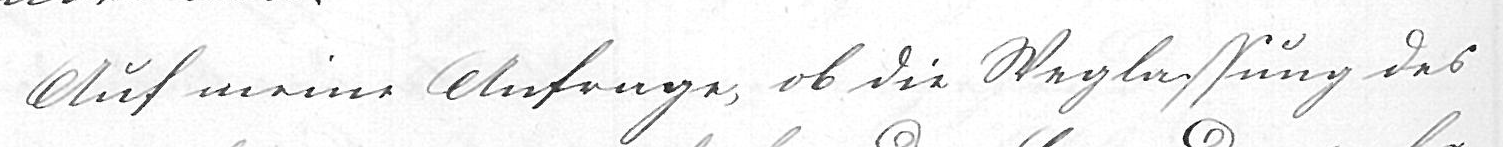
Auf meine Anfrage, ob die Weglassung des
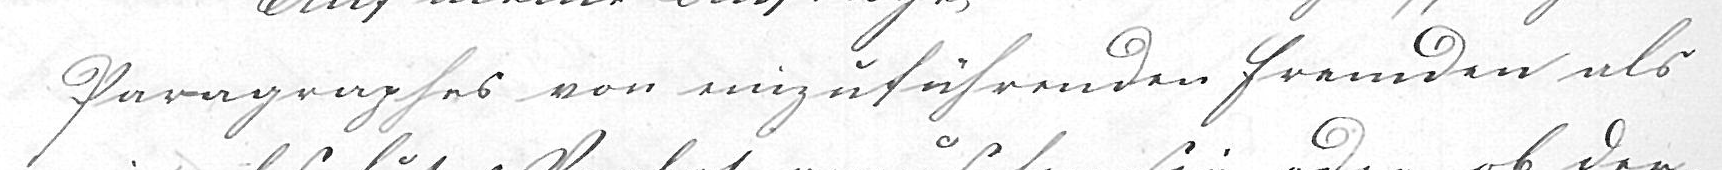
Paragraphes von einzuführenden Fremden als
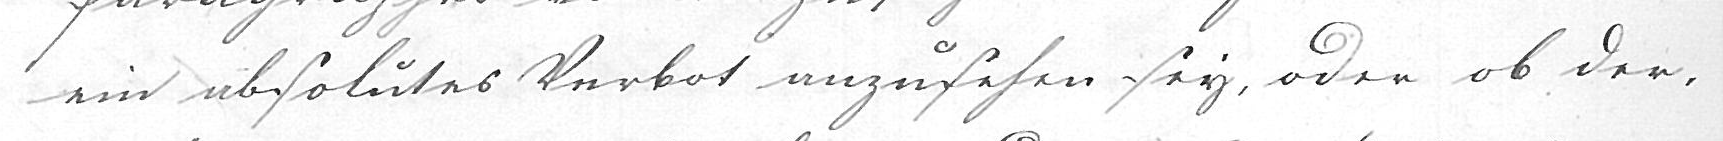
ein absolutes Verbot anzusehen sey, oder ob der-
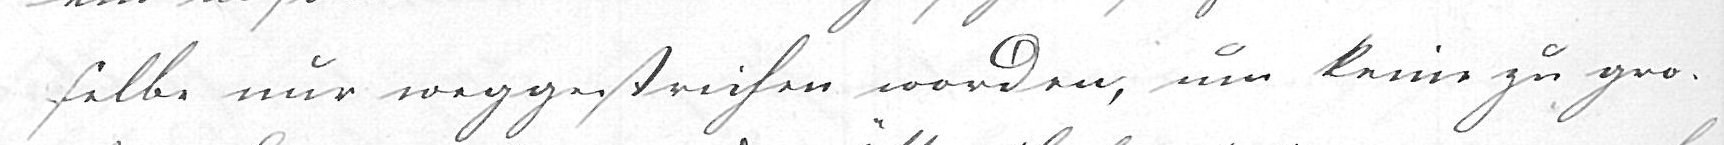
selbe nur weggetrichten worden, um keine zu gro-
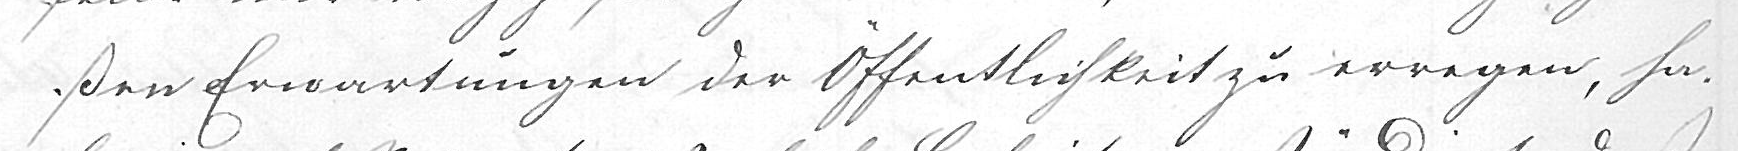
ßen Erwartungen der Öffentlichkeit zu erregen, ha-
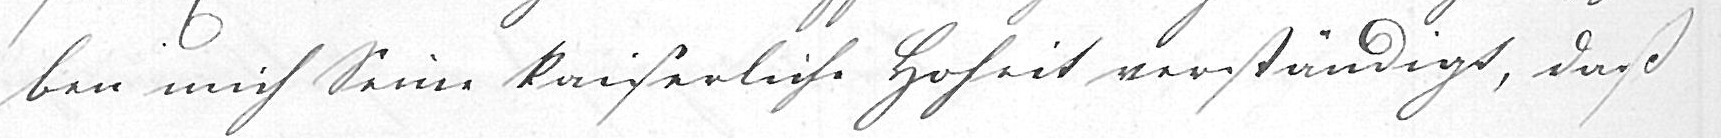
ben mich Seine kaiserliche Hoheit verständigt, daß
